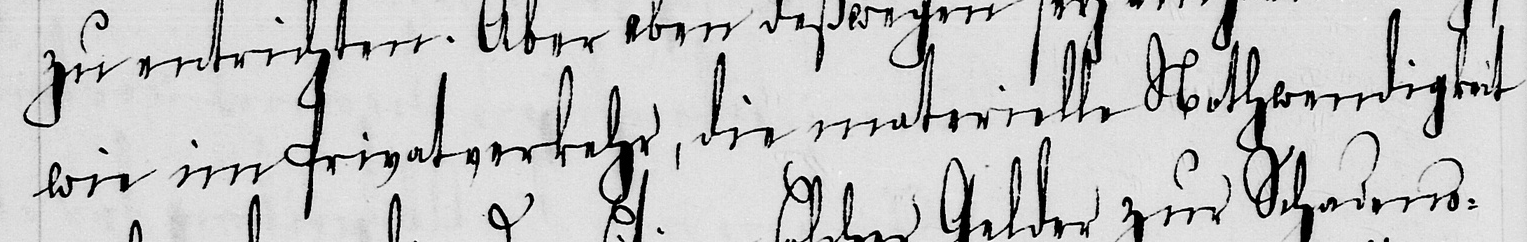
wie im Privatverkehr, die materielle Nothwendigkeit
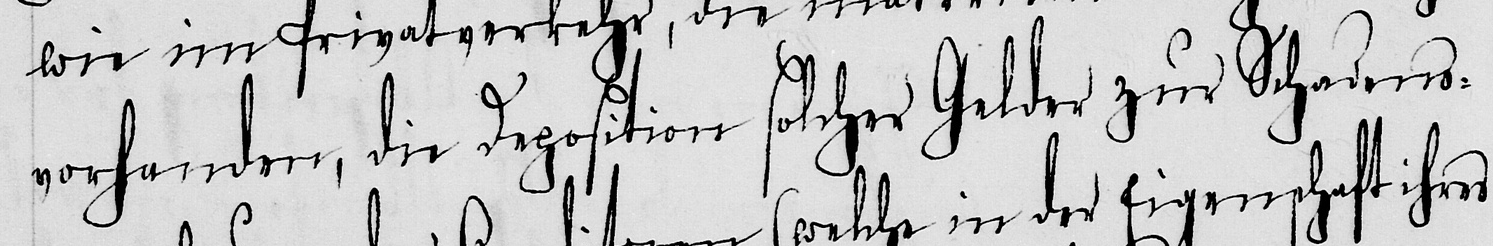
vorhanden, die Deposition solcher Gelder zur Schadens¬
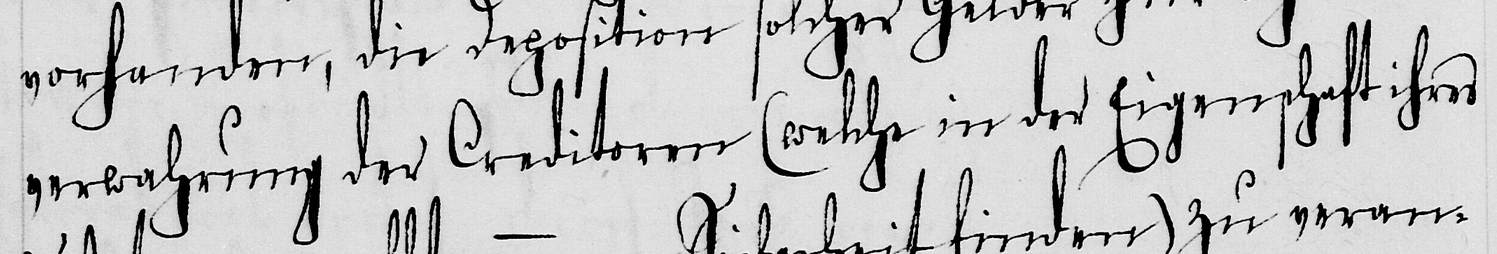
verwahrung der Creditoren (welche in der Eigenschaft ihr¬
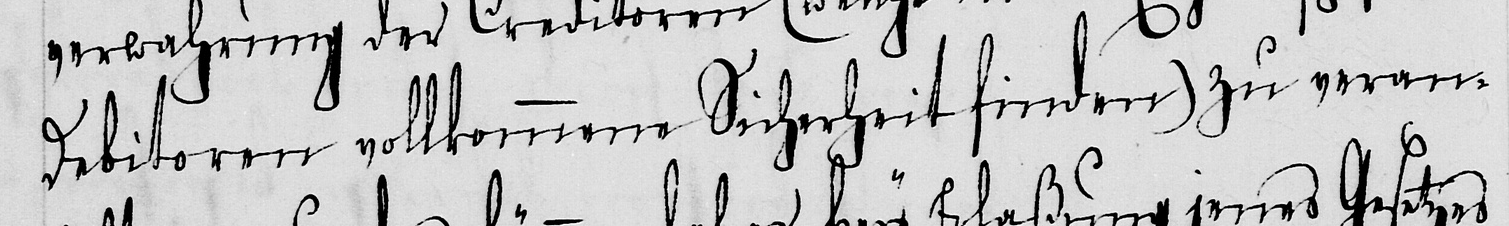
Debitoren vollkommene Sicherheit finden) zu verans¬
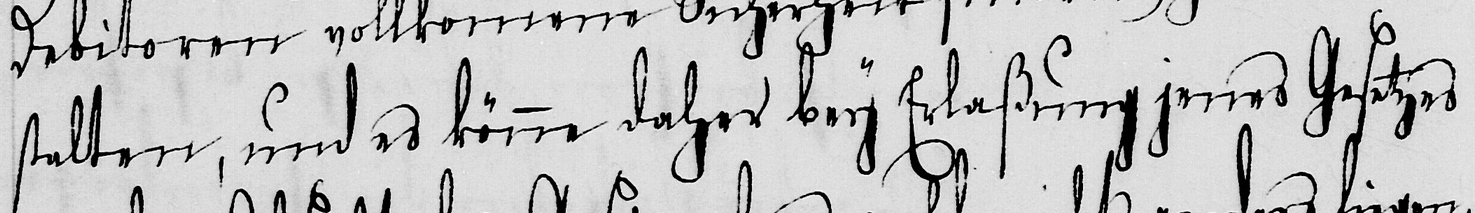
talten, und es könne daher bey Erlaßung jenes Gesetz¬
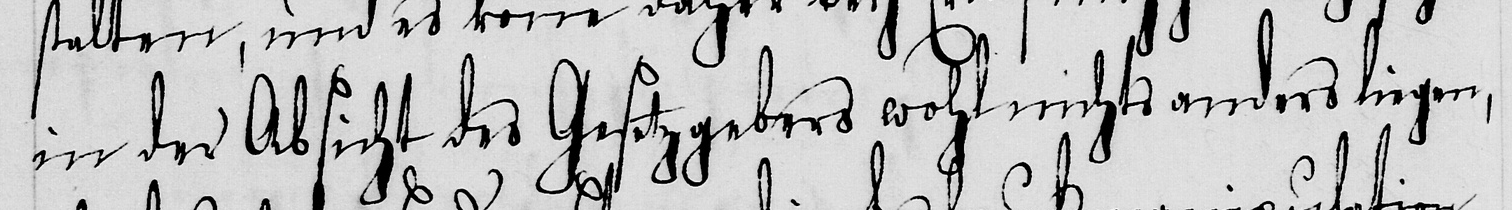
in der Absicht des Gesetzgebers wohl nichts anders liegen,
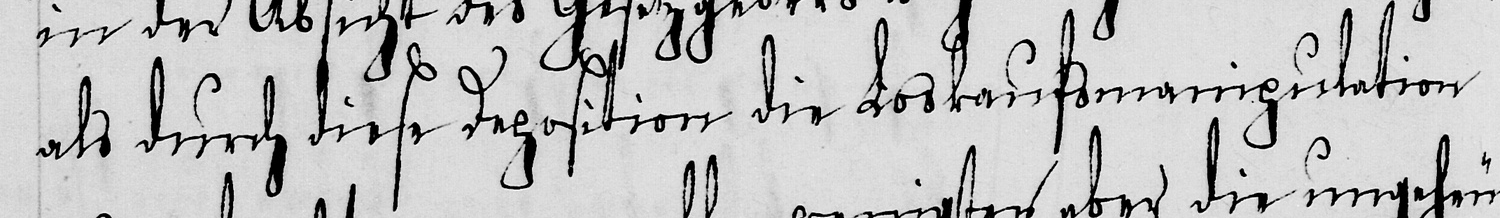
als durch diese Deposition die Loskaufsmanipulation
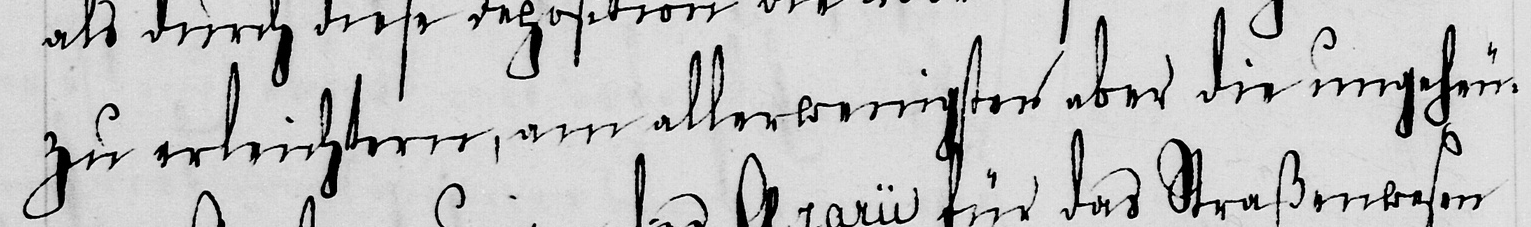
zu erleichtern, am allermeisten aber die ungeheu¬
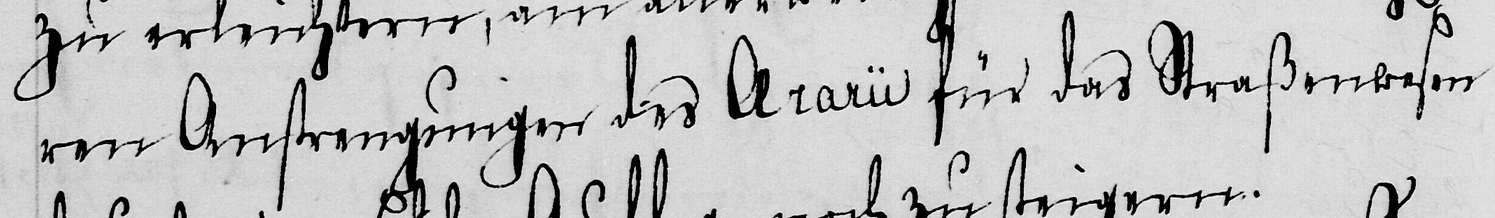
ren Anstrengungen des Ararii für das Straßenwesen
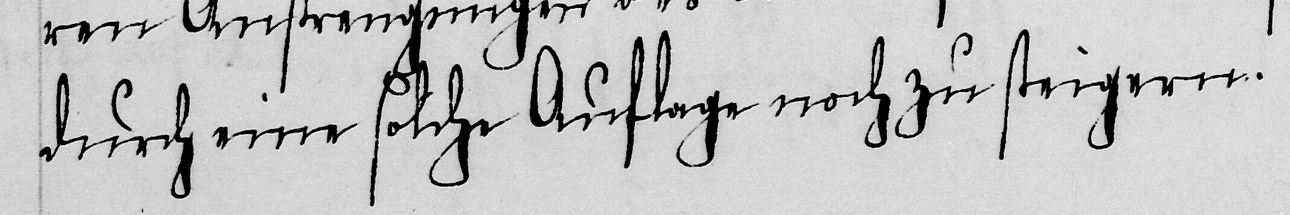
durch eine solche Auflage noch zu steigern.
